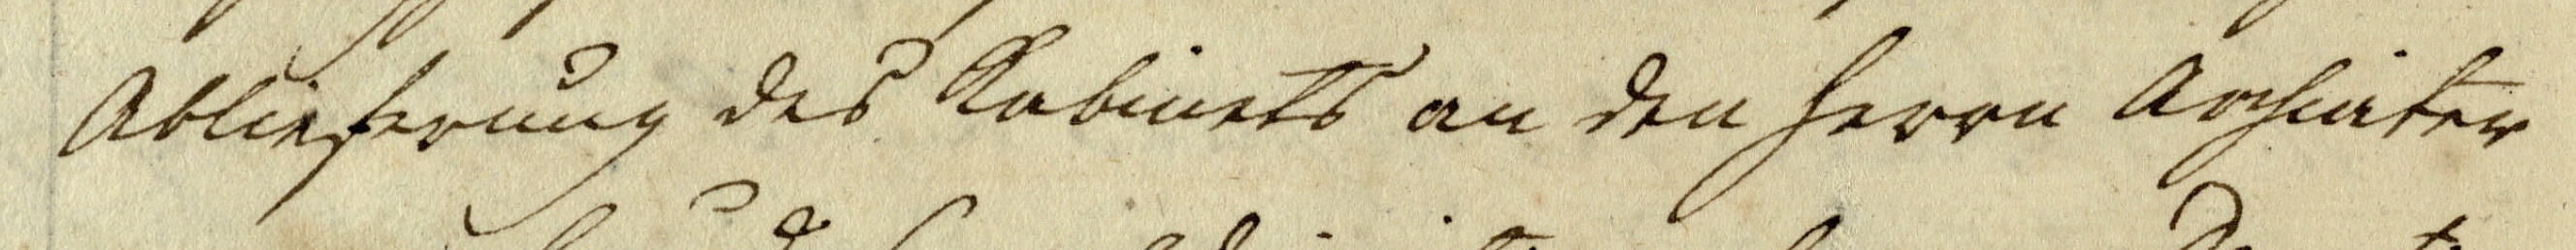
Ablieferung des Kabinets an den Herrn Archiater
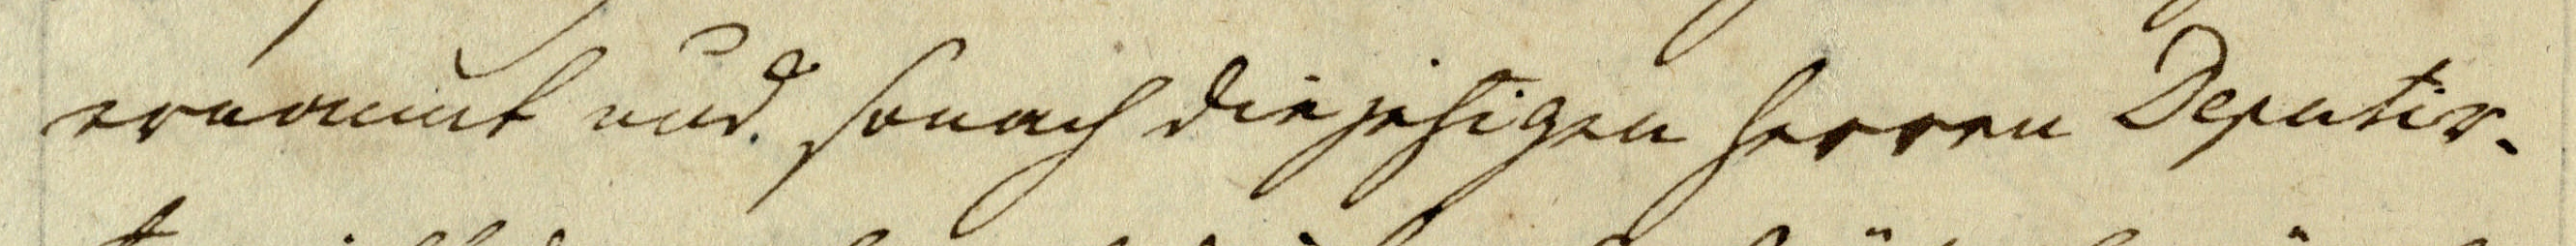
ernannt und sonach die jezigen Herren Deputir¬
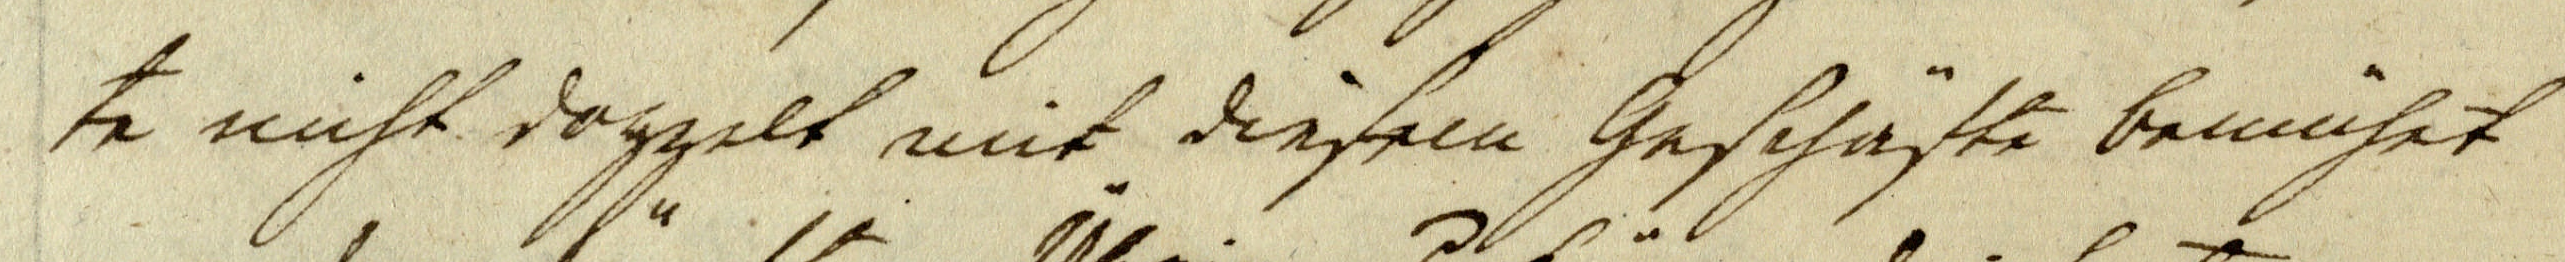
te nicht doppelt mit diesem Geschäfte bemühet
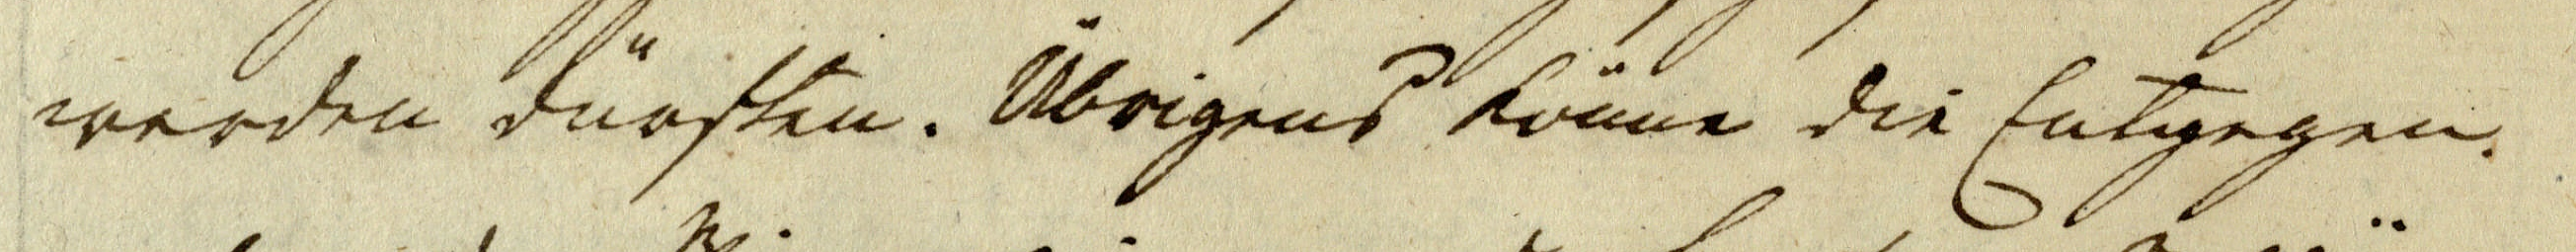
werden dürften. Übrigens könne die Entgegen¬
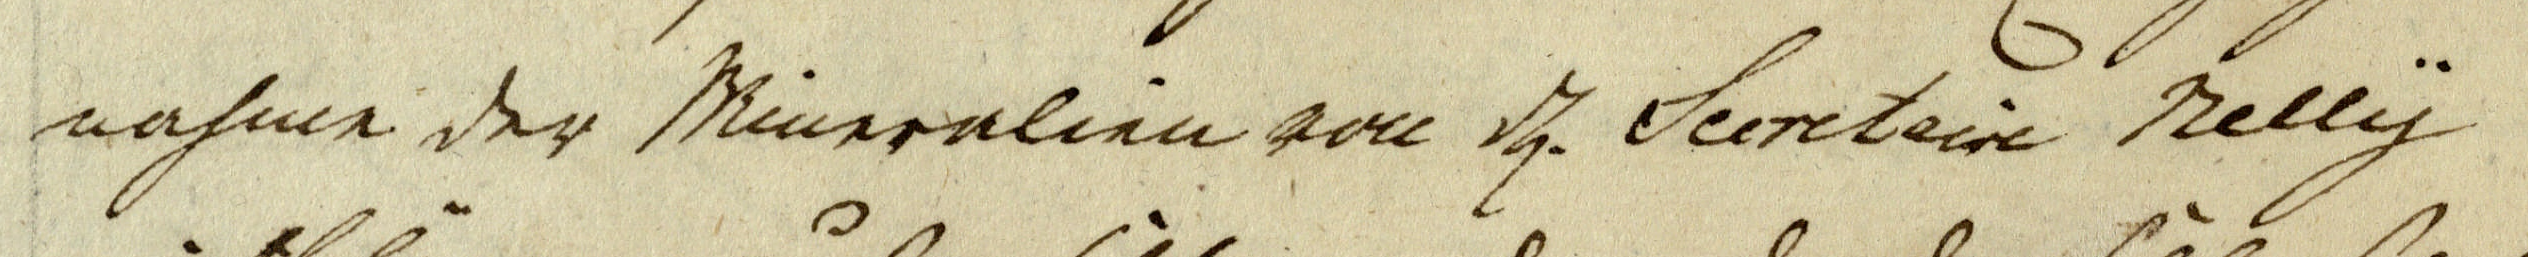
nahme der Mineralien von dh. Secretaire Nellÿ
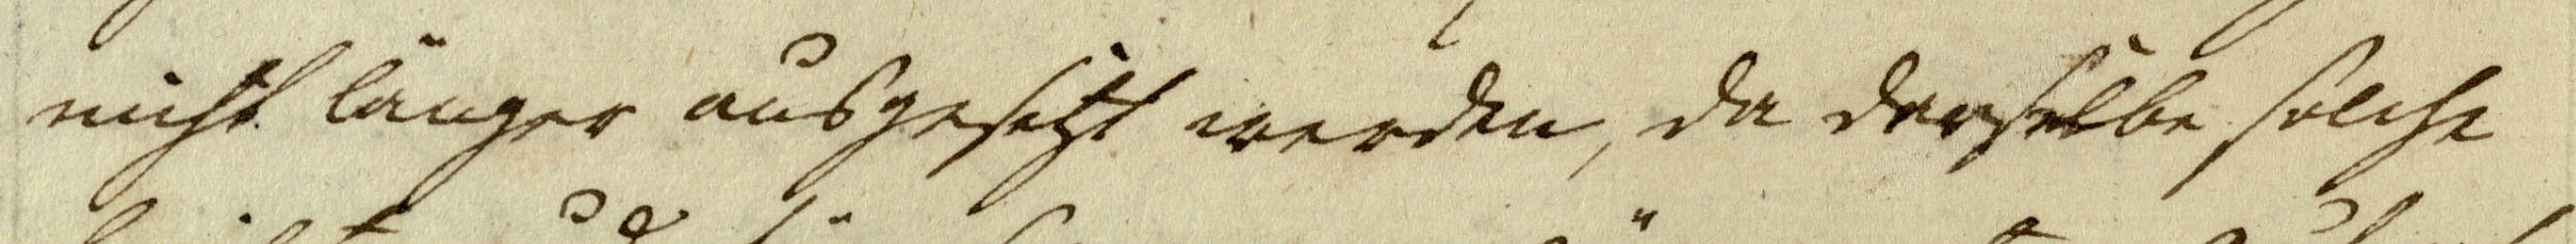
nicht länger ausgesetzt werden, da derselbe solche
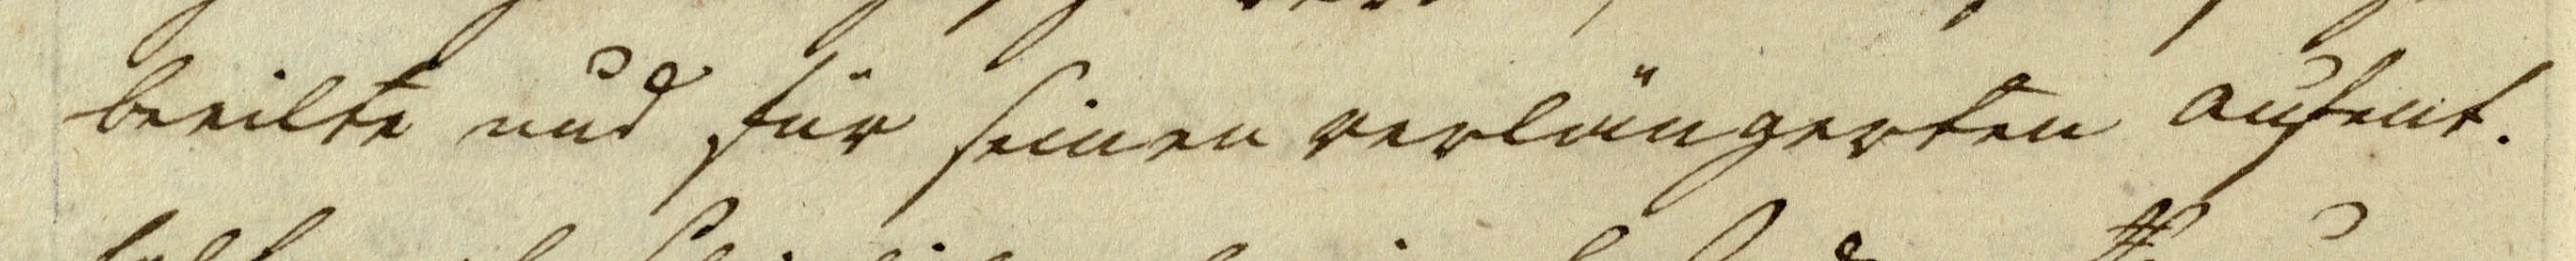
beeilte und für seinen verlängerten Aufent¬
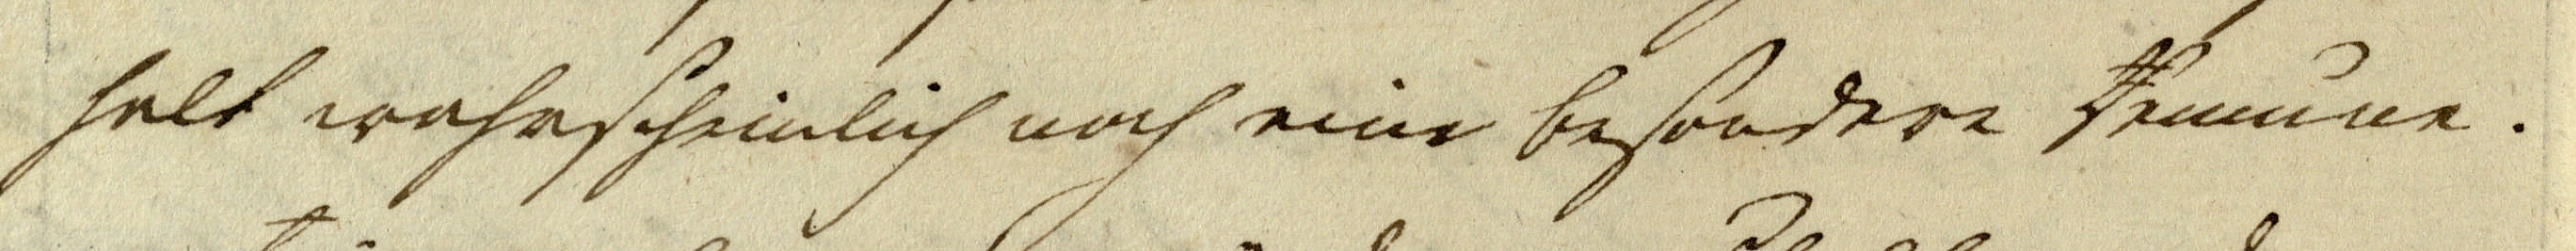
halt wahrscheinlich noch eine besondere Remune¬
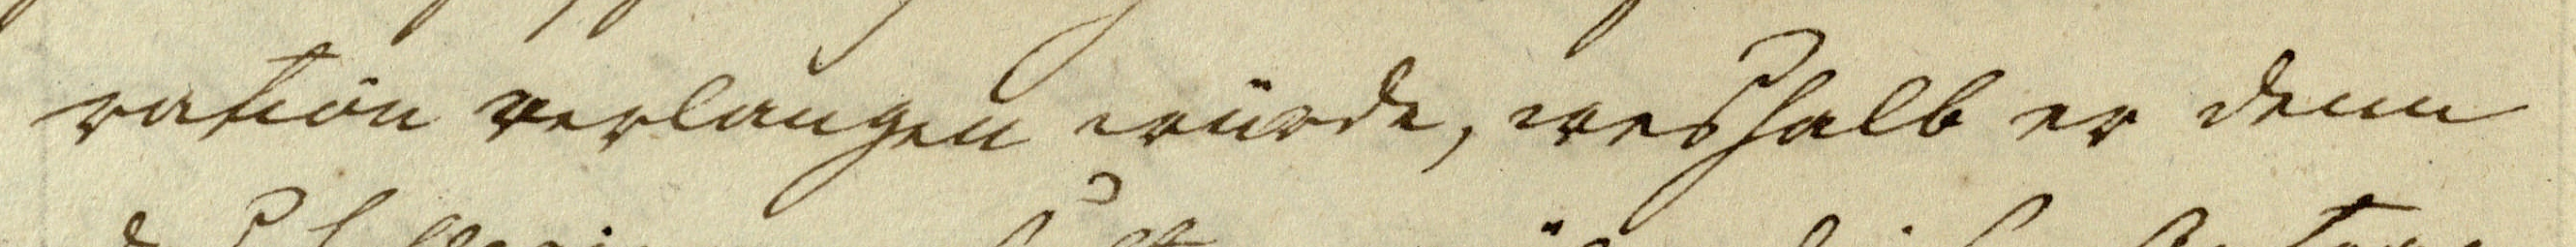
ration verlangen würde, weshalb er denn
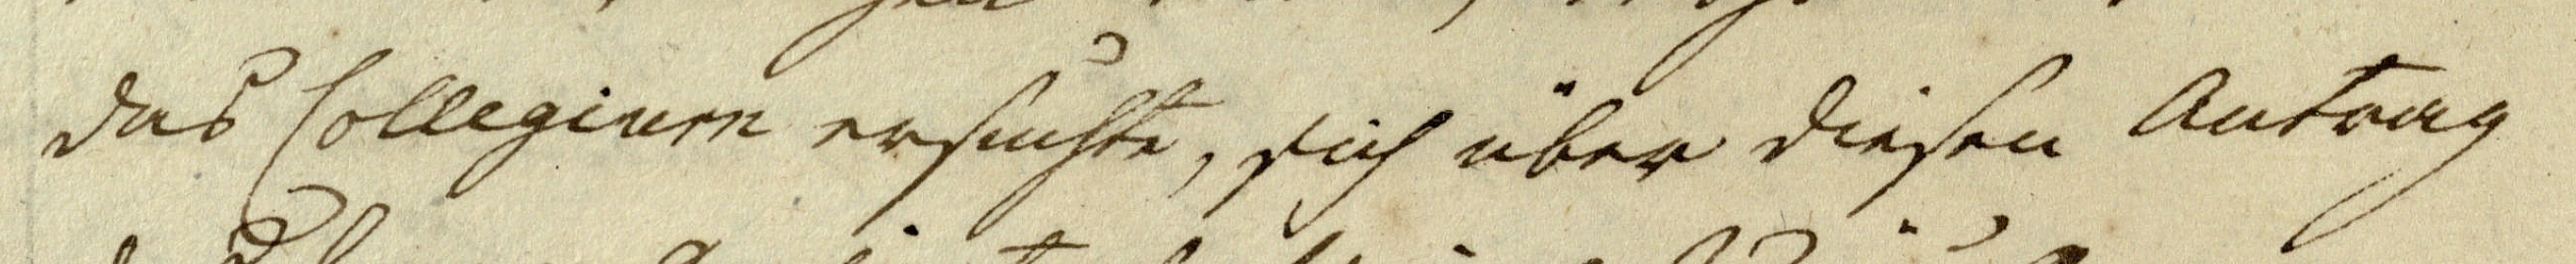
das Collegium ersuchte, sich über diesen Antrag
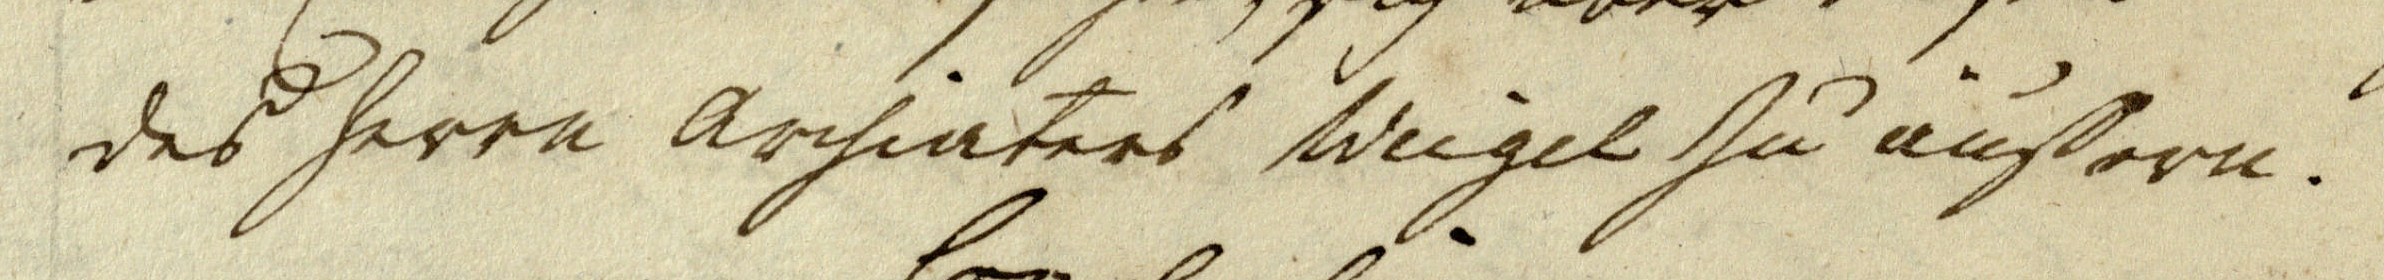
des Herrn Archiaters Weigel zu äussern.
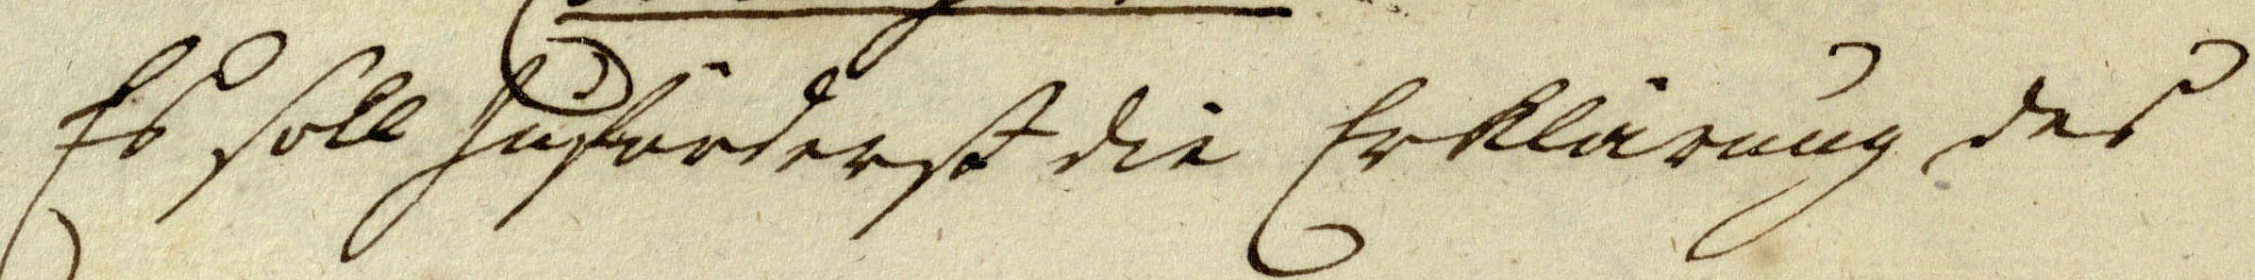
Es soll zuförderst die Erklärung des
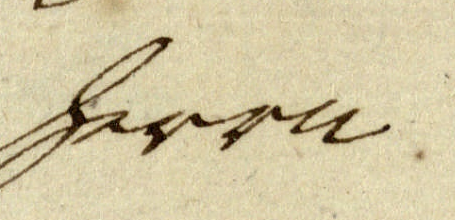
Herrn
